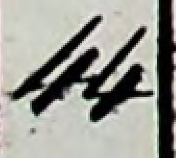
44
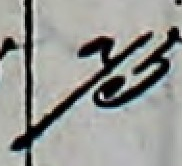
75
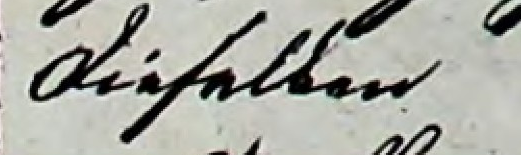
Dieselben
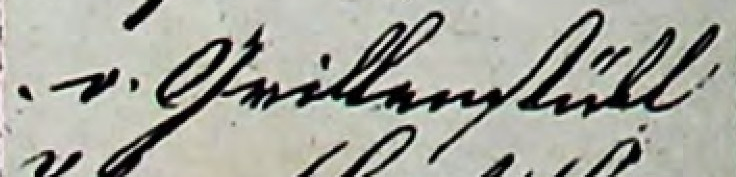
v. Griltenstübl
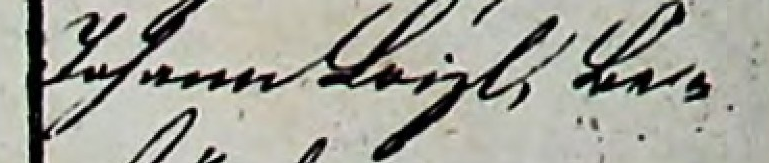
Johann Loizl, Be„
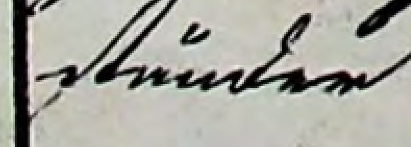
ständer
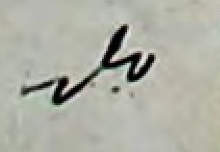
do
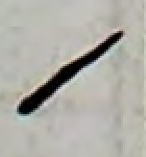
1
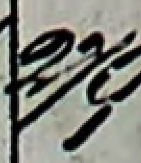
279
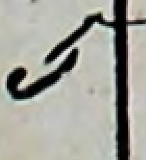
5
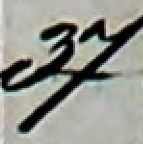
37
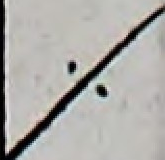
./.
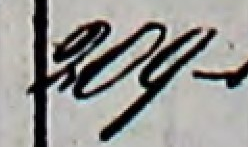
209
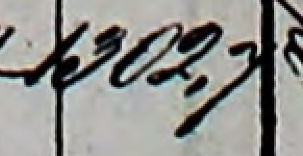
1302,7
